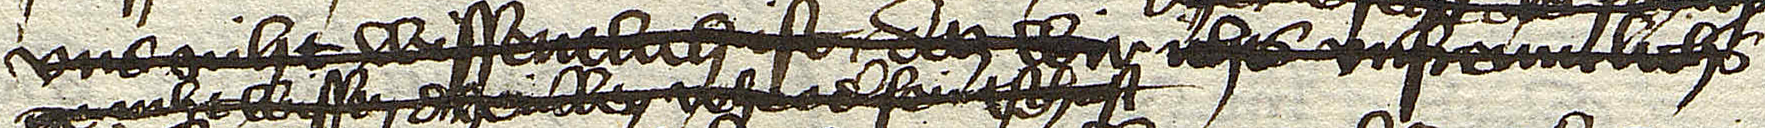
vns niht wiſſentlich iſt / daʒ wir ichts vnfreuntlichs
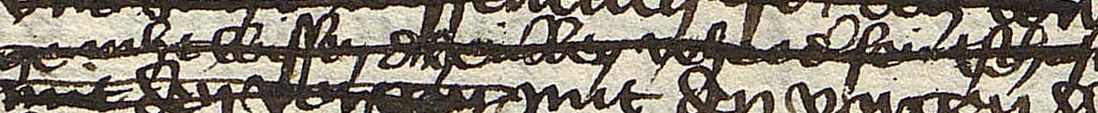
ge niht wiſſen dhein*ley vehe od* feintſchaft
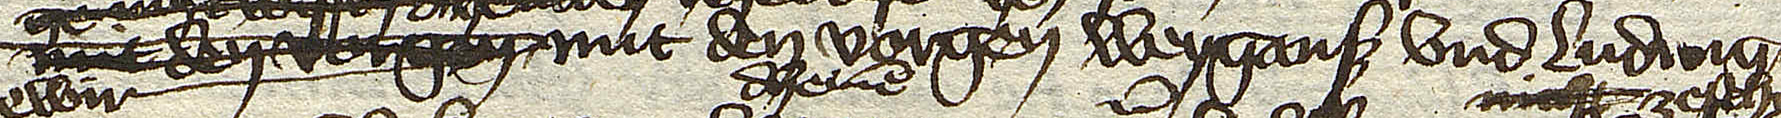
mit den vorgen* mit den vorgen* weyganſʒ vnd ludwig*
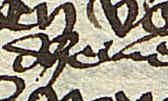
dheine*
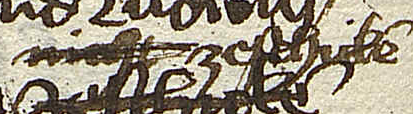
niht ʒeſchike*
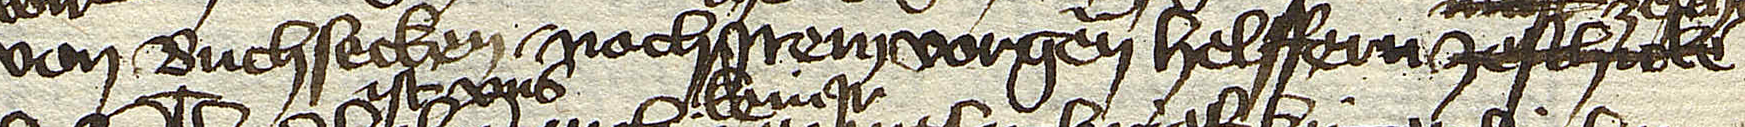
von Buchſecken / noch Irem vorgen* helffern ʒeſchicke*
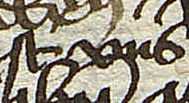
iſt vns
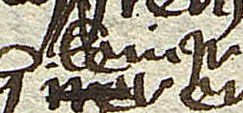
kein Ir
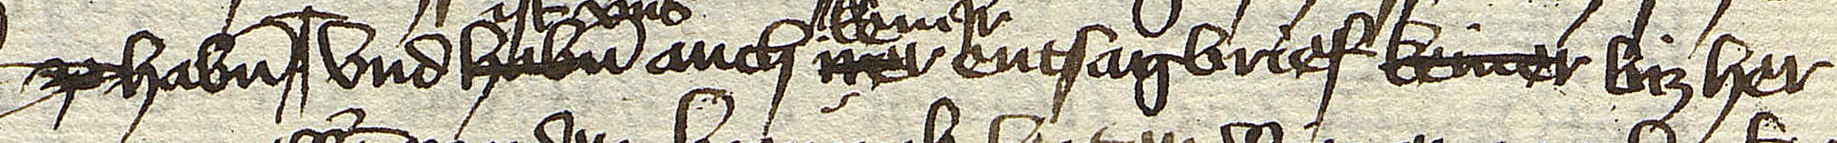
cʒe hab*n vnd hab*n auch irer entſagbrief keiner biʒ her
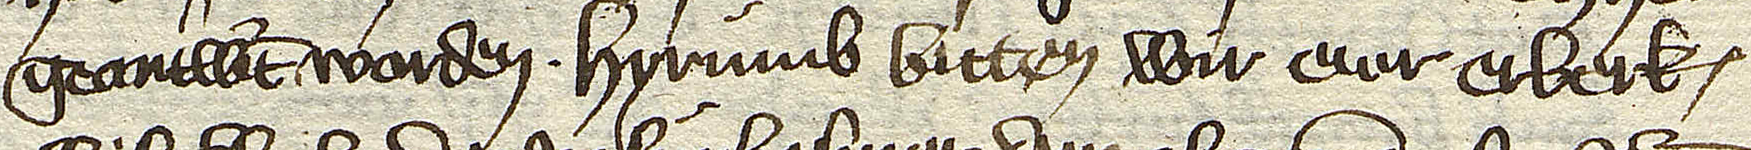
geantw*t worden . Hyrümb bitten wir ewr erberk*
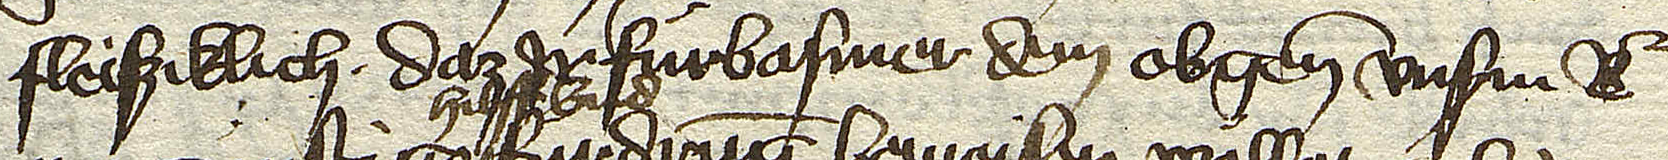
fleiſʒiklich . daʒ Ir fürbaſmer dem obgen* vnſ*m B*
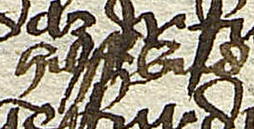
hilff vnd
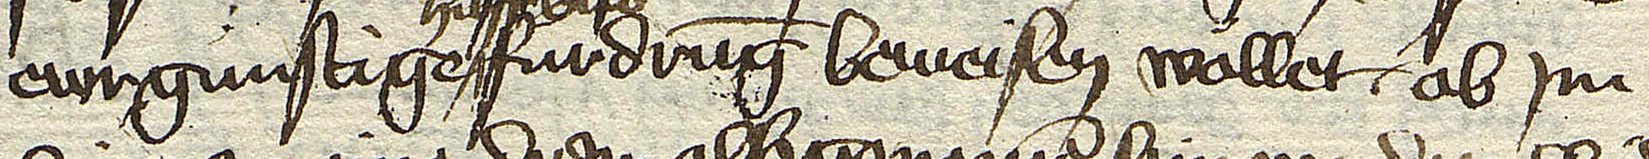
ewr günſtige furdru*g beweiſen wöllet / ob Im
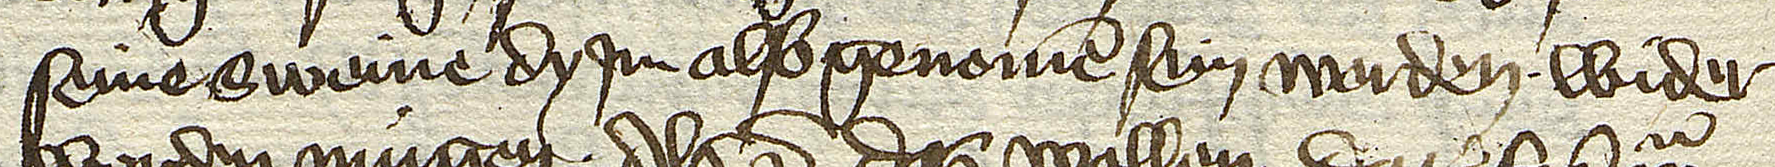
ſeine Sweine dy Im alſo genome* ſein worden . wider
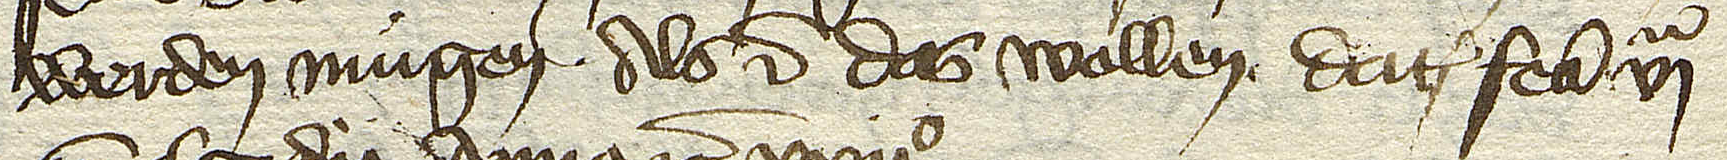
werden mügen . Als ec* das wollen . Dat* fea* vi*
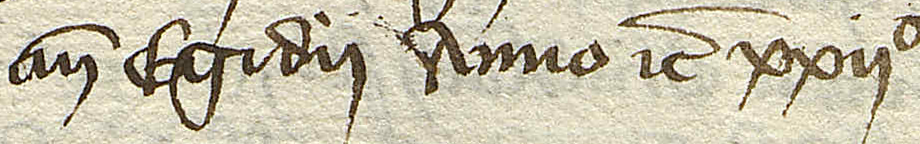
an* Egidii Anno ec* xxii
